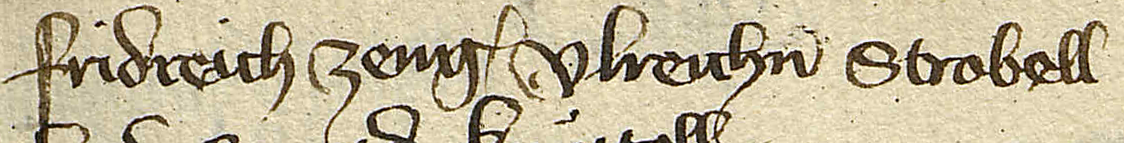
Fridreich cʒe%g* . Vlreichn* Strobell
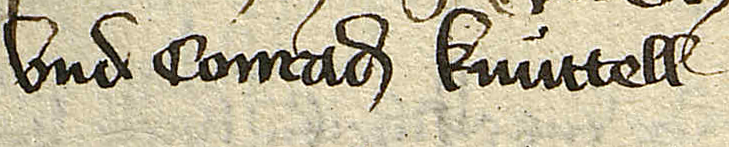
vnd Conrad* Knüttell
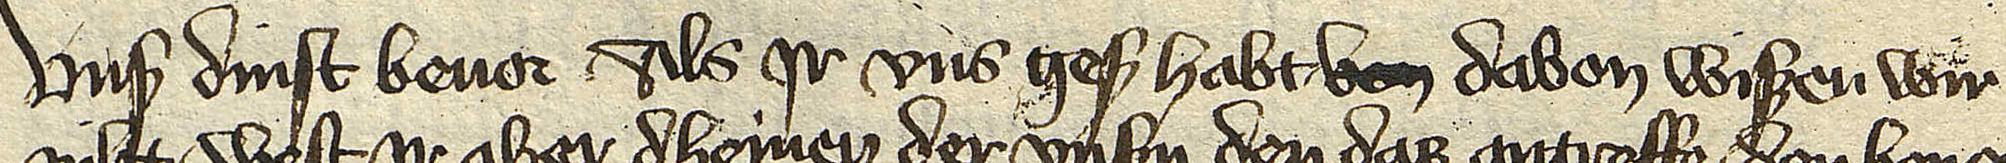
Vnſ* dinſt beuor / Als Ir vns geſ* habt von davon wiſʒen wir
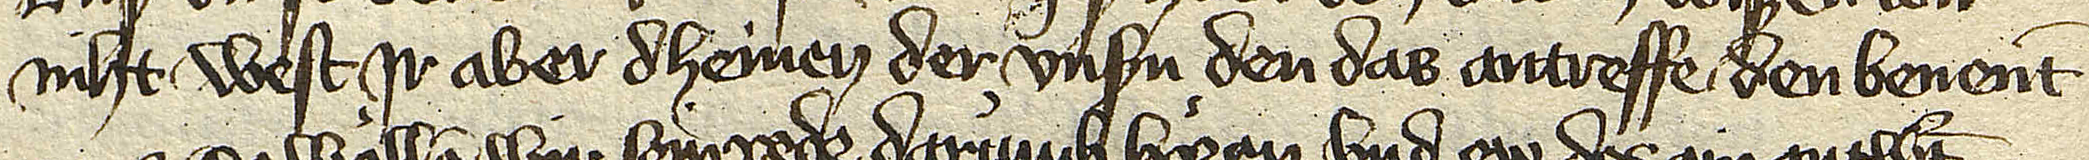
niht / weſt Ir aber dheinen der vnſ*n den das antreffe / den benent*
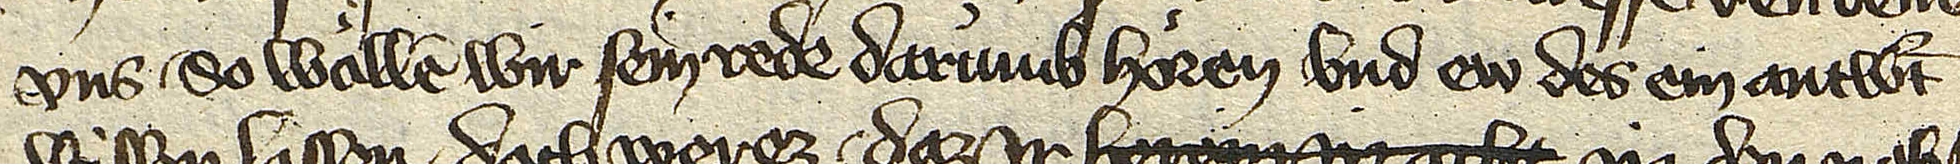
vns / So wölle* wir ſein rede darümb hören / vnd ew des ein antw*t
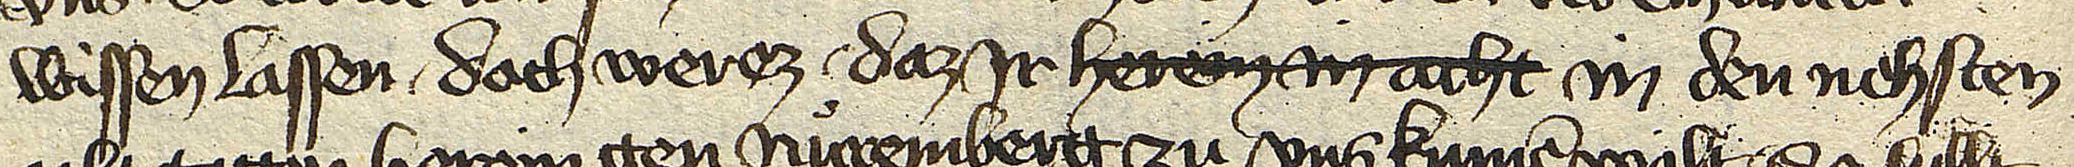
wiſſen laſſen / doch wereʒ / daʒ Ir herein in acht in den nehſten
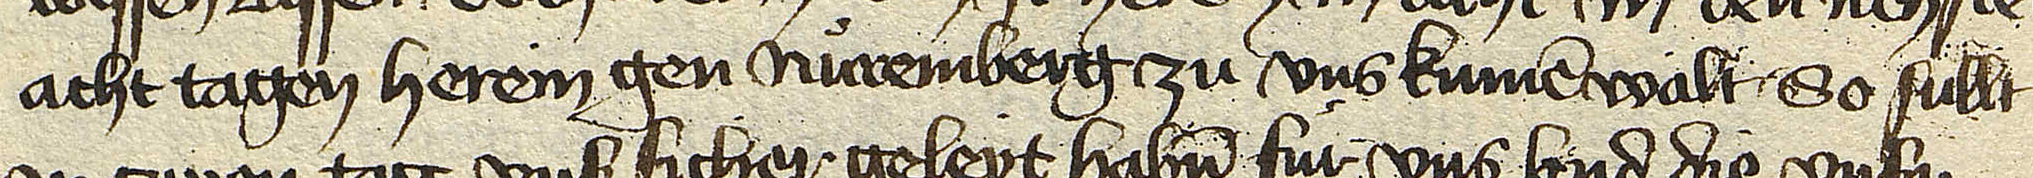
acht tagen herein gen Nüremberg cʒu vns kume* wolt / So ſullt
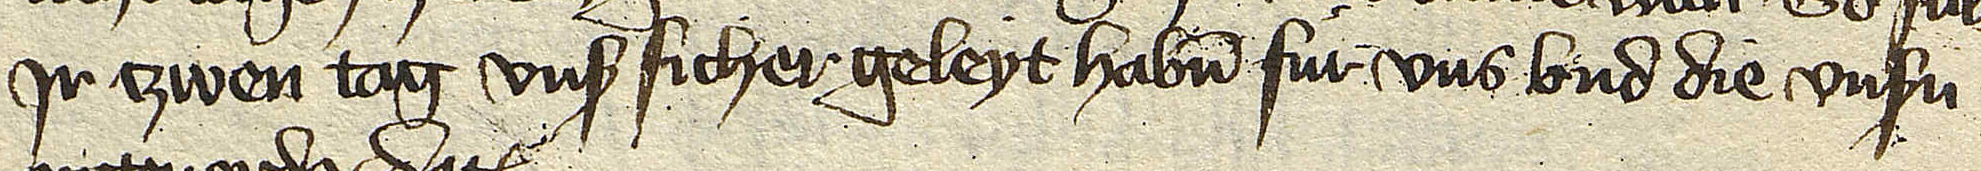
Ir cʒwen tag vnſ* ſicher geleyt habn* für vns vnd die vnſ*n
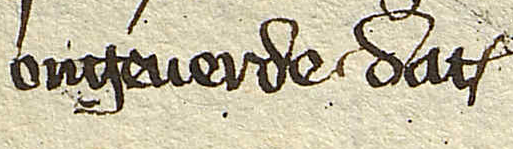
ongeuerde / dat*
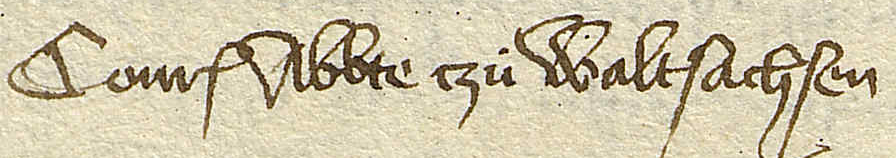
Conr* Abbte cʒu Waltſachſen
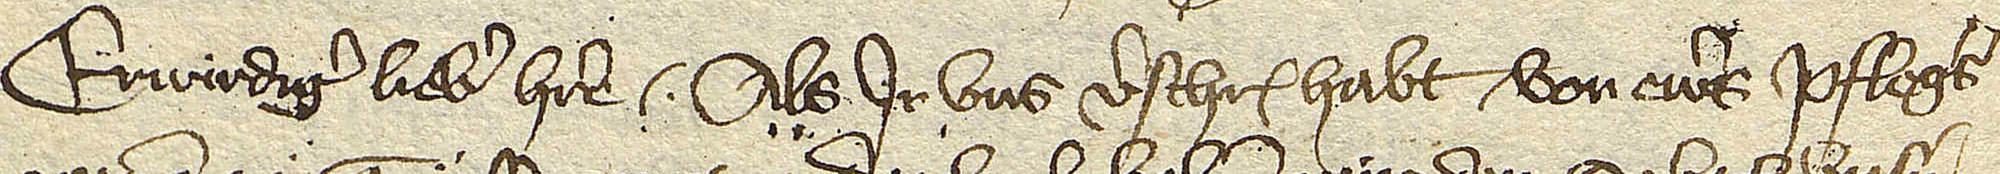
Erwirdig* lieb* hr*e / . Als Ir vns v*ſchr* habt / von ew*s Pflegs*
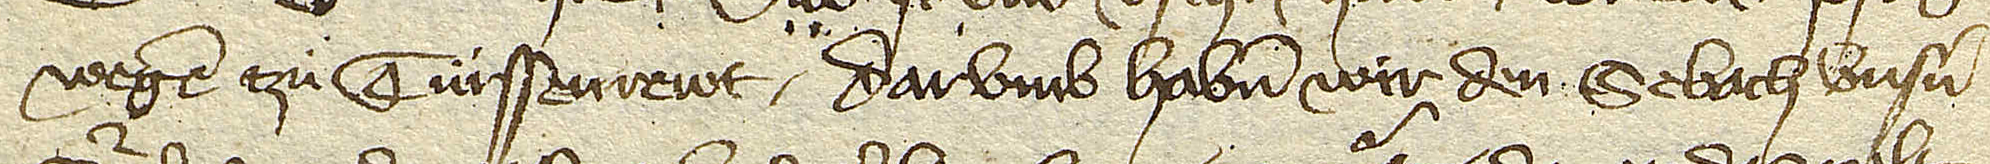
wege* cʒü Türſſenrewt / Darvmb habn* wir den Sebach vnſn*
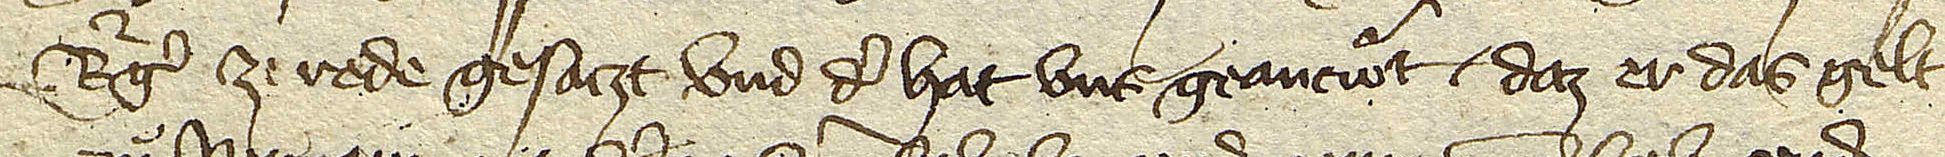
B*g* cʒe rede geſacʒt vnd d* hat vns geantw*t / daʒ er das gelt
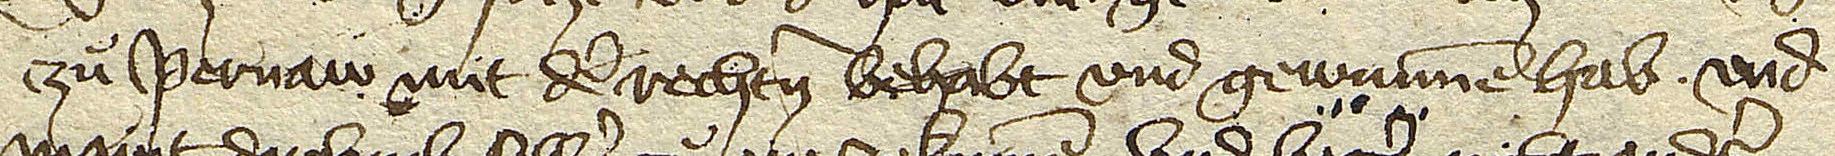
cʒü Pernaw mit d* rechtn* behabt vnd gewunne* hab . vnd
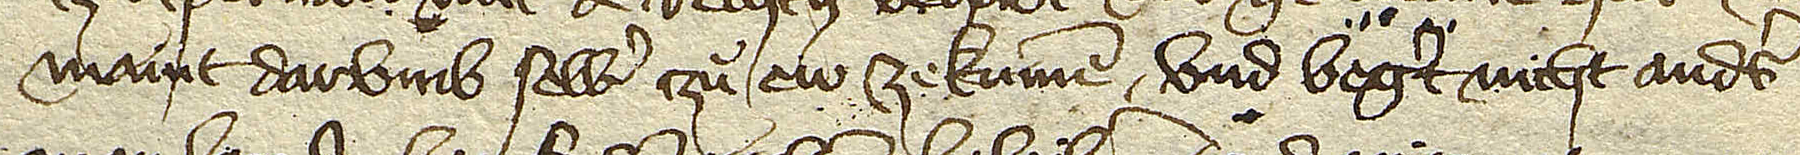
maint darvmb ſelb* cʒü ew cʒekume* / vnd beg*t nicht ands*
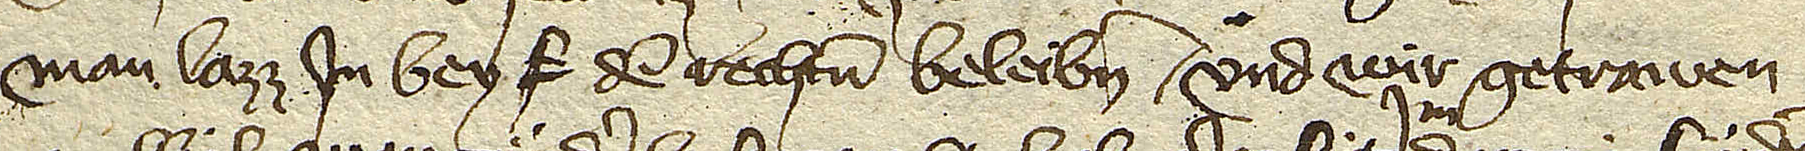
man laʒʒ In bey f d* rechtn* beleibn* / vnd wir getrawen
